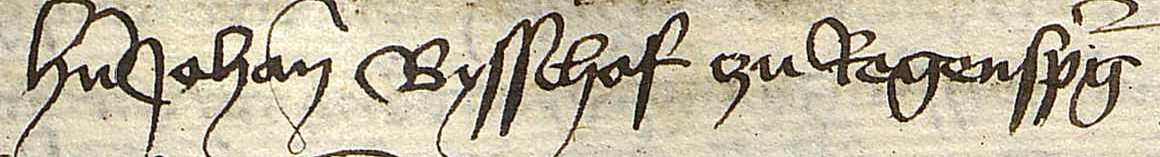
H*n Iohan* Byſſchof cʒu Regenſp*g
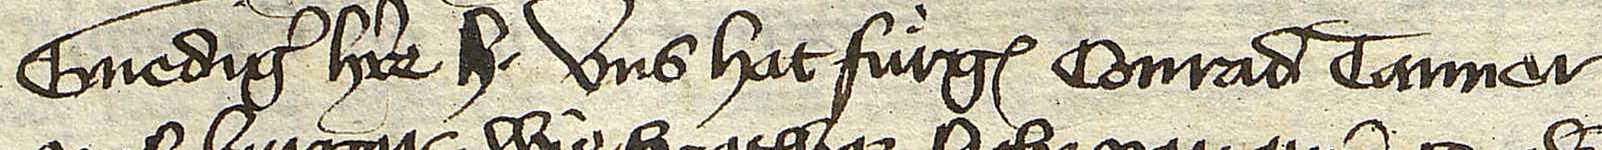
Gnedig* h*re h* Vns hat fürg* Conrad Tanner
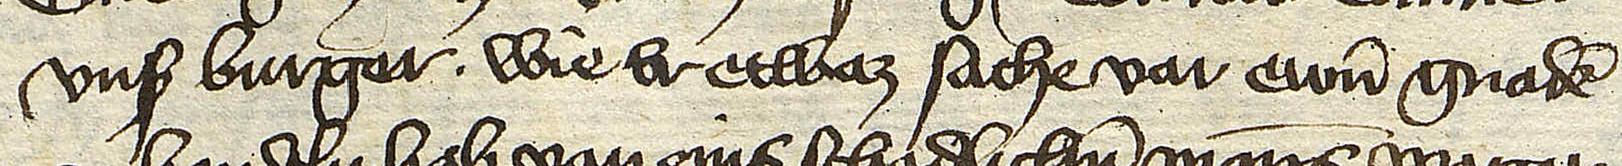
vnſ* burger . wie Er etwaʒ ſache vor ew*n gnade*
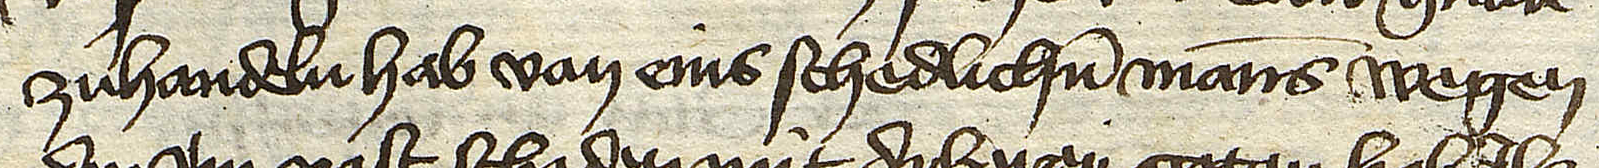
ʒuhandeln hab von eins ſchedlich*n mans* wegen
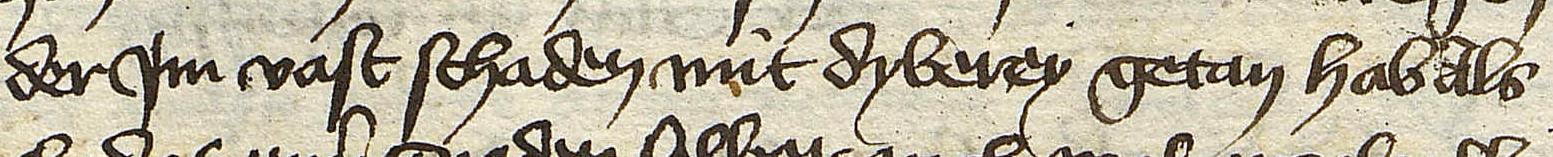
der Im vaſt ſchaden mit dyberey getan hab Als
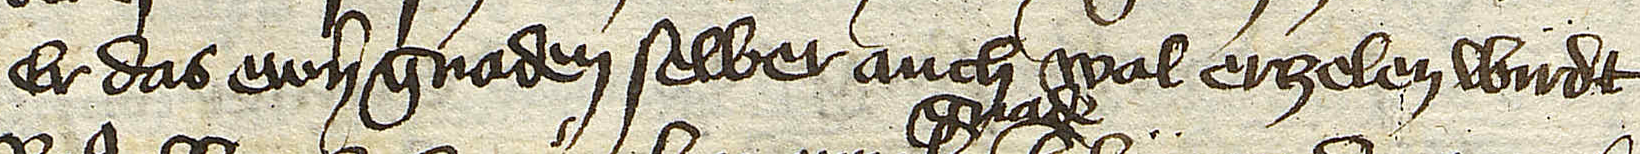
Er das ew*n gnaden ſelber auch wol ercʒelen würdt
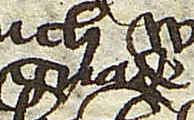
gnade
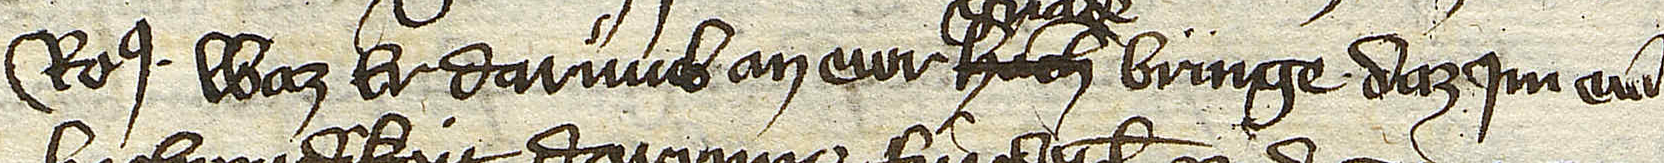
Ro* . waʒ Er darümb an ewr hoch* bringe . daʒ Im ew*
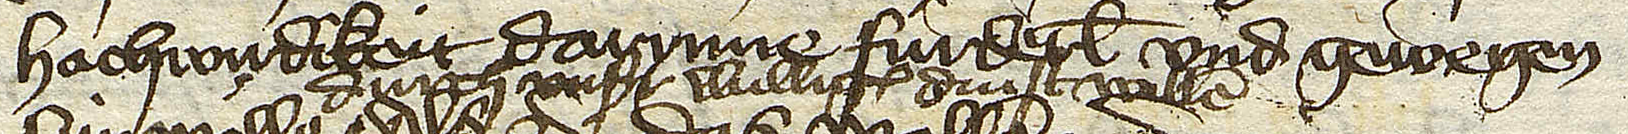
hochwirdikeit darynne fürderl* vnd gewegen
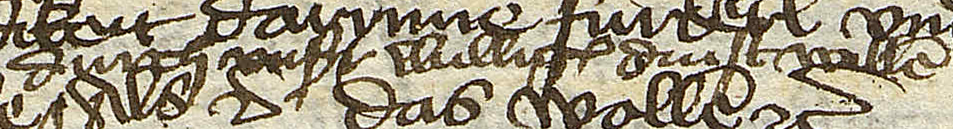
durch vnſ*r willig* dinſt wille*
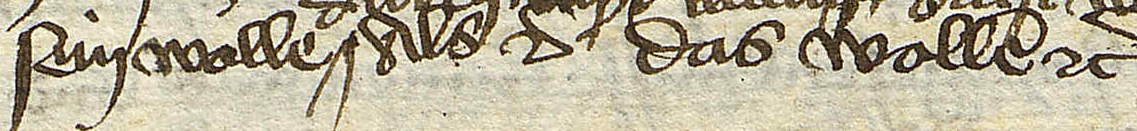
ſein wölle . Als ec* das wölle* ec*
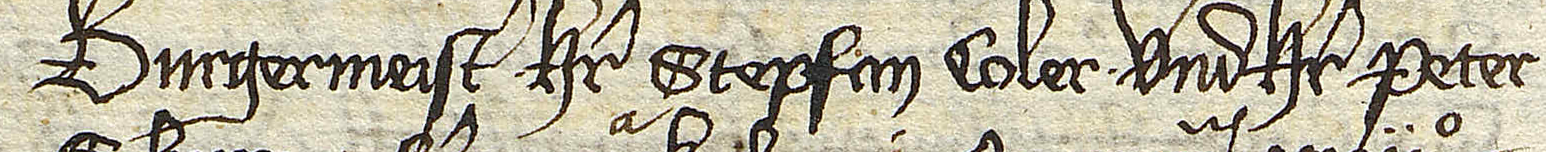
Burgermeiſt* . H*r Stepfan Coler . Vnd H*r Peter
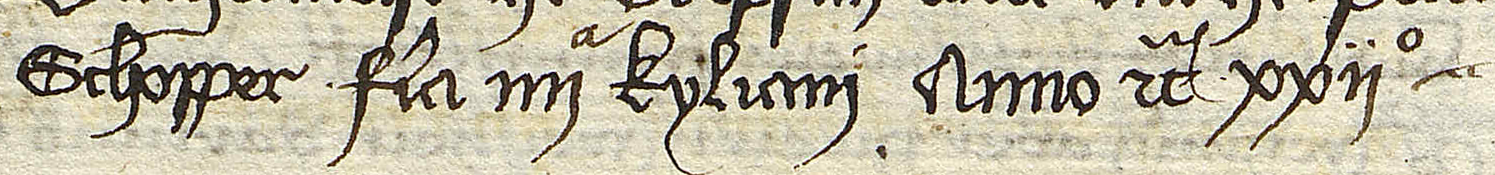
Schopper* . fia iiii* Kyliani Anno ec* xxii* /
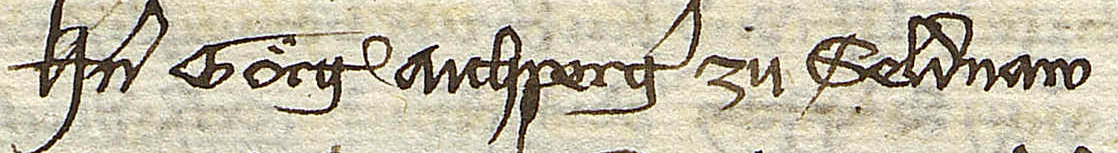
H*n Görg* aichperg* ʒu Seldnaw
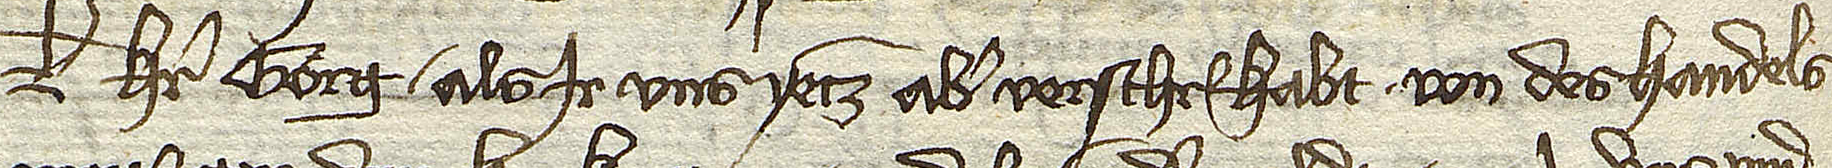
L* h*r Görg / als Ir vns yecʒ* ab* verſchr* habt . von des handels
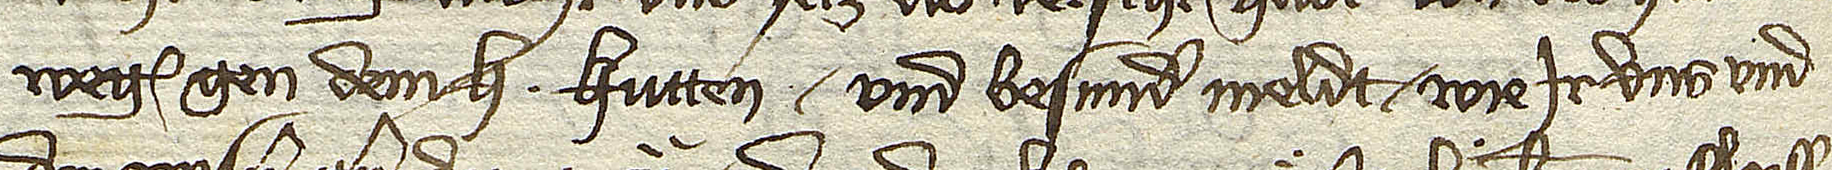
weg* gen dem h* . hutten . / vnd beſund* meldt / wie Ir Vns vnd
